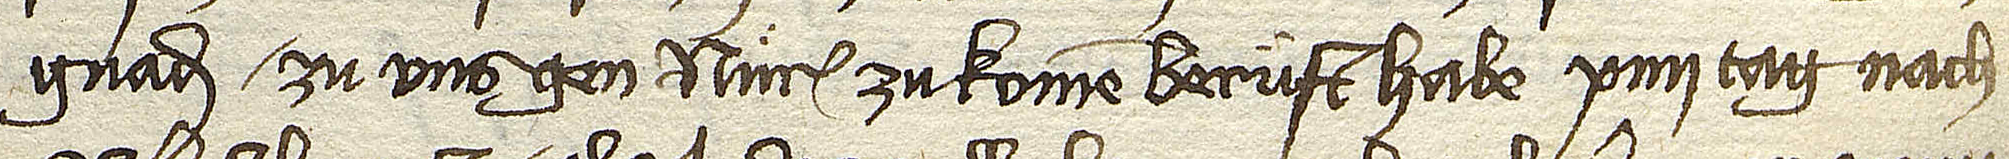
gnad* / ʒu vns gen Nür* ʒukome* berüft habe xiiii tag nach
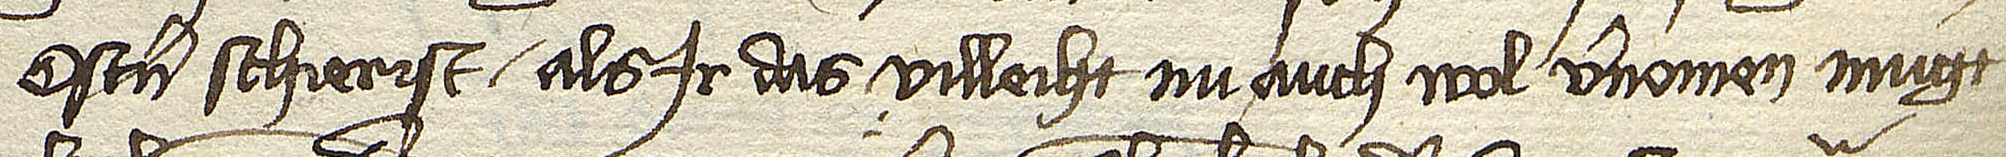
Oſtn* ſchieriſt / als Ir das villeiht nu auch wol v*nomen mugt
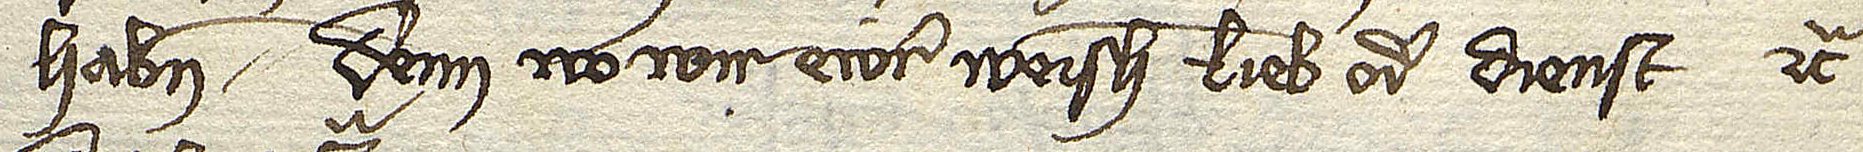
habn* / Denn wo wir eẅr* weiſh* lieb od* dienſt ec*
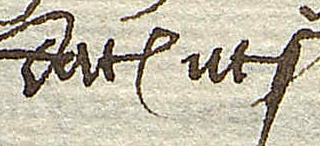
Dat* ut ſ*
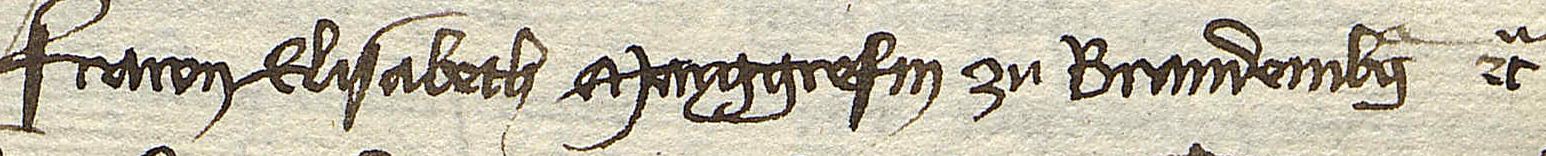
Frawn Eliſabeth Marggrefin ʒu Brandemb*g ec*
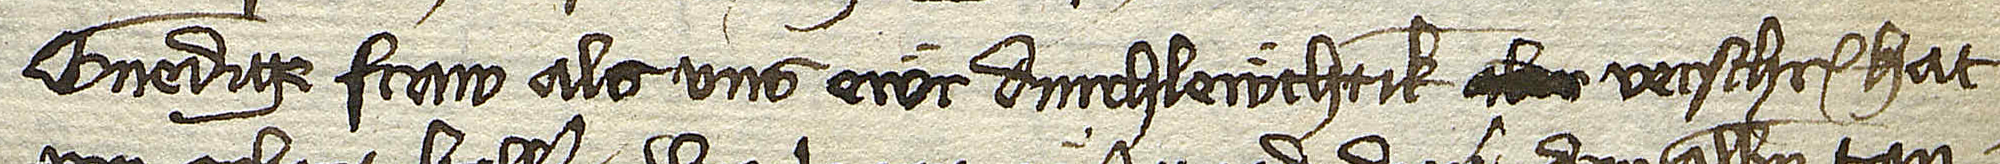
Gnedige fraw als vns eẅr durchleẅchtikl* aber verſchr* hat
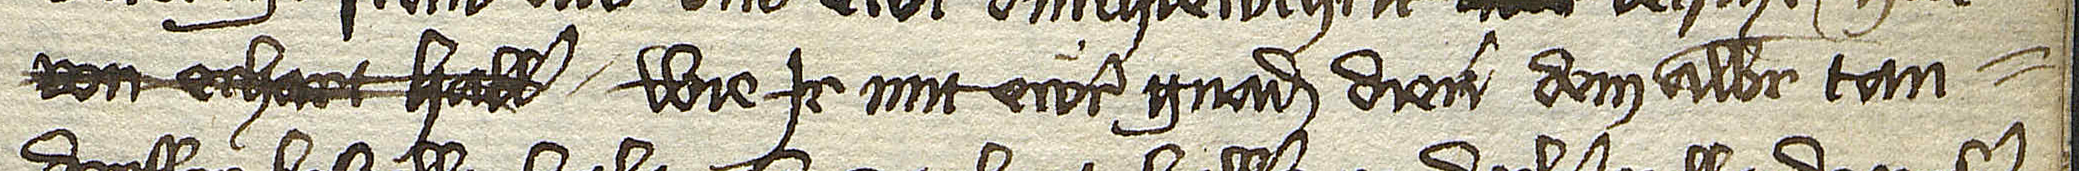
von erhart hall* / wie Ir mit eẅr* gnad* dien* dem albr* tan =
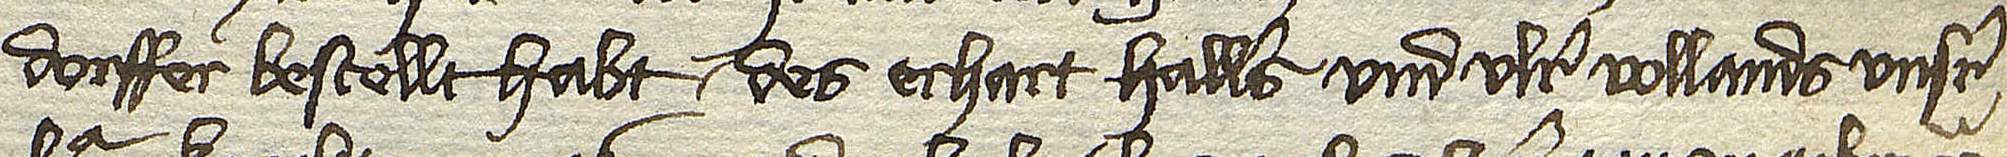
dorffer beſtellt habt / des erhart hall*s vnd vlr* vollands vnſr*
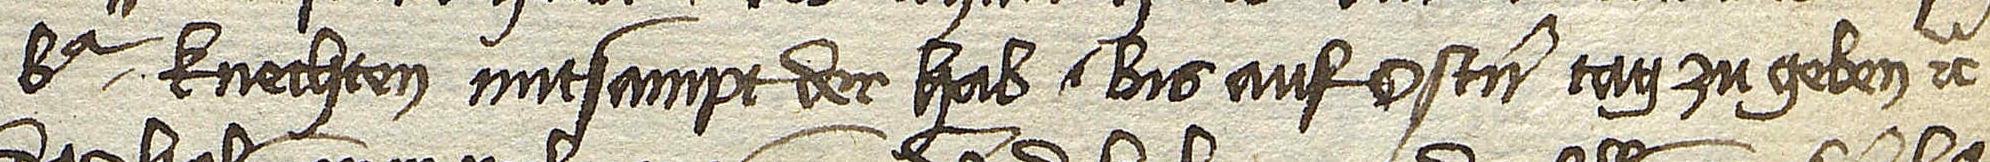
b* / knechten mitſampt der hab / bis auf Oſtn* tag ʒu geben ec*
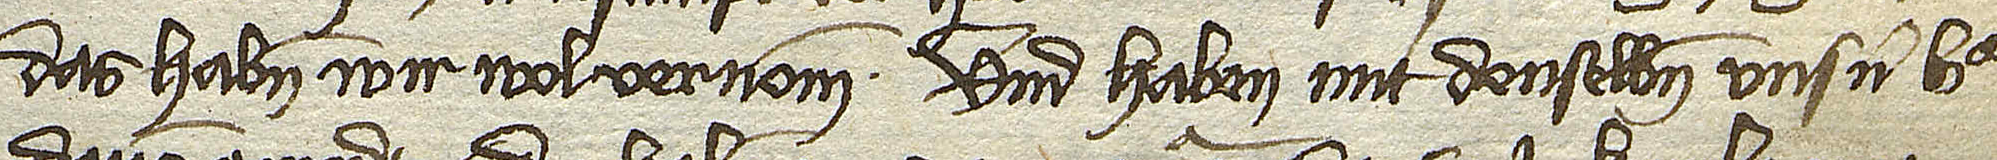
Das habn* wir wol vernom* . Vnd haben mit denſelbn* vnſn* b*
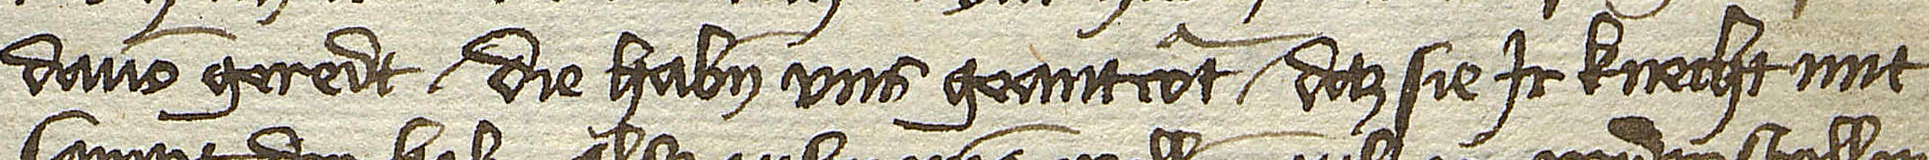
dauo* geredt / Die habn* vns geantw*t / daʒ ſie Ir knecht mit
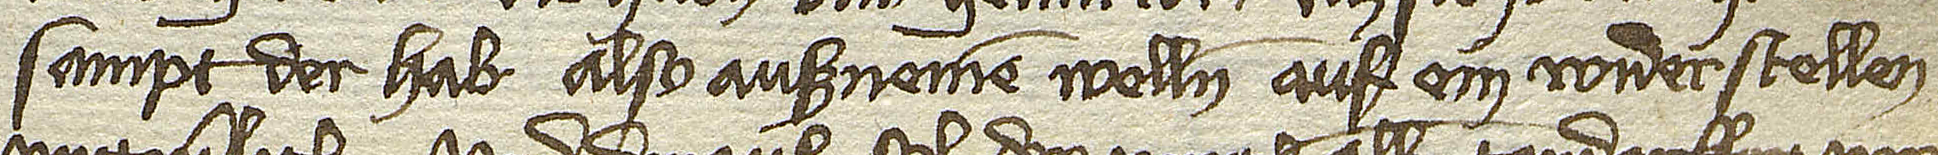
ſampt der hab alſo auſʒneme* welln* auf ein widerſtellen
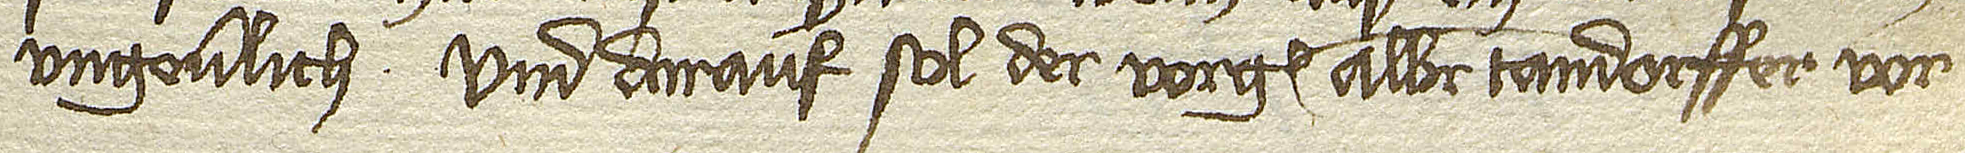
vngeu*lich . vnd darauf ſol der vorg* albr* tandorffer vor
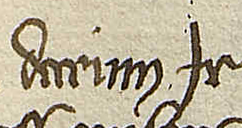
darinn Ir
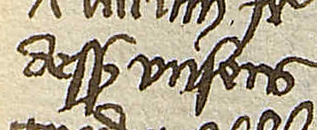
deſſ* vnſers
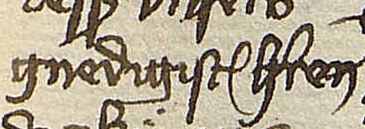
gnedigiſt* h*ren
